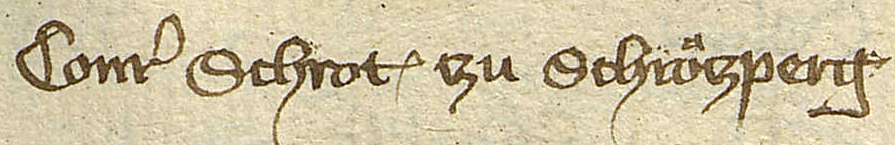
Conr* Schrot* cʒu Schröcʒperg
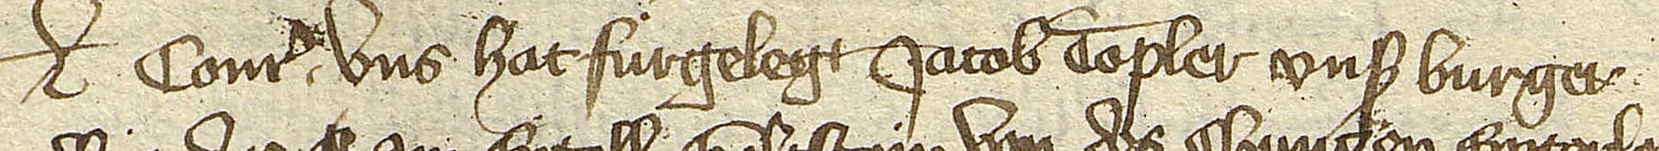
L* Conr* / Vns hat fürgelegt Iacob Topler vnſ* burger
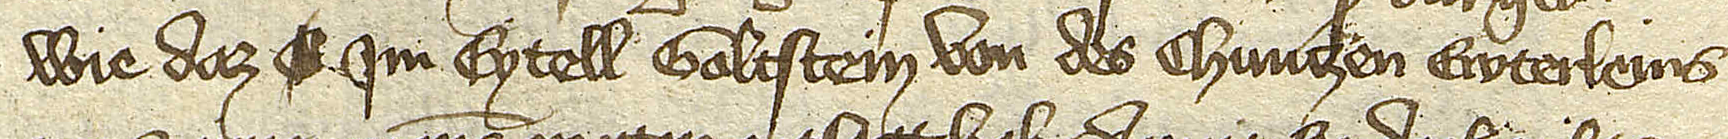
wie daʒ E Im Eytell Goltſtein von des Chuncʒen Ewterleins
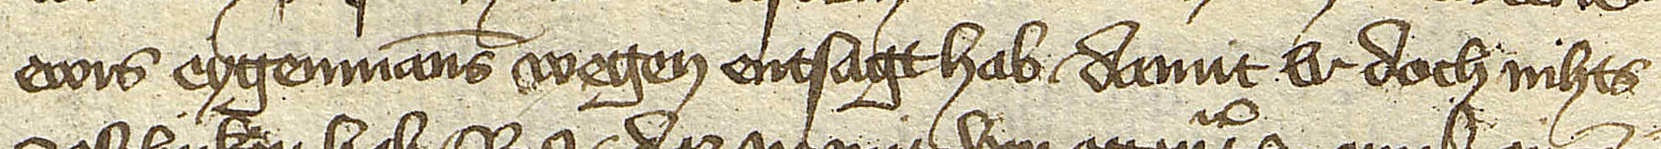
ewrs eygenmans* wegen entſagt hab / damit Er doch nihts
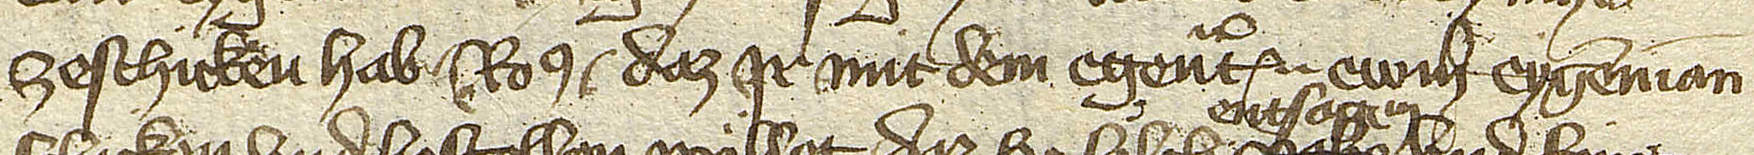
cʒeſchicken hab / Ro* / daʒ Ir mit dem egen*t* ~ ewm* eyge*man*
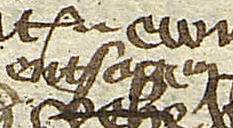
entſagen
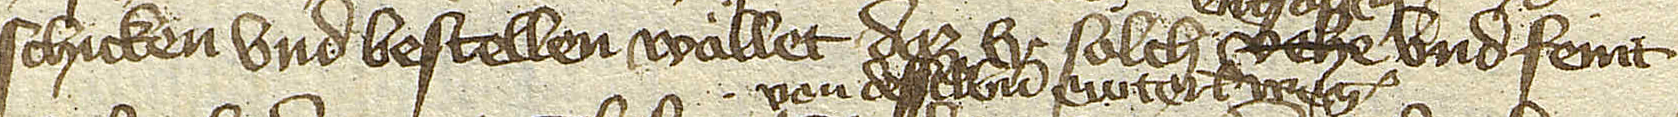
ſchicken vnd beſtellen wöllet daʒ Er ſölch vehe vnd feint
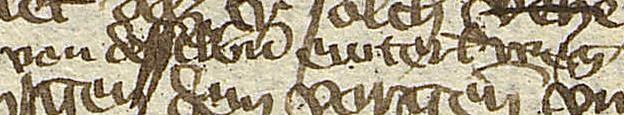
von deſſelbn* ewterl* weg*
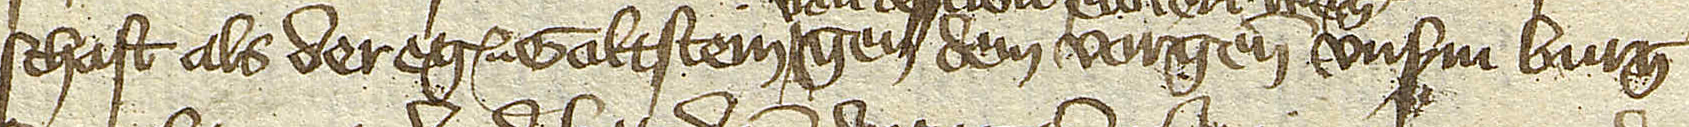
ſchaft als der eg* ~ Goltſtein gen dem vorgen* vnſ*m burg*
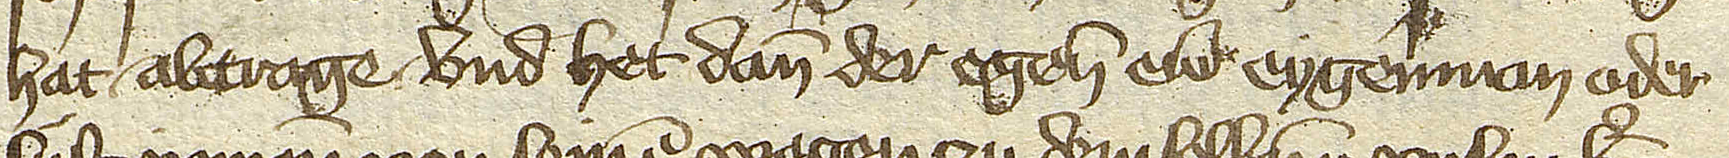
hat / abtrage / vnd het dan* der egen* ew* eygenman oder
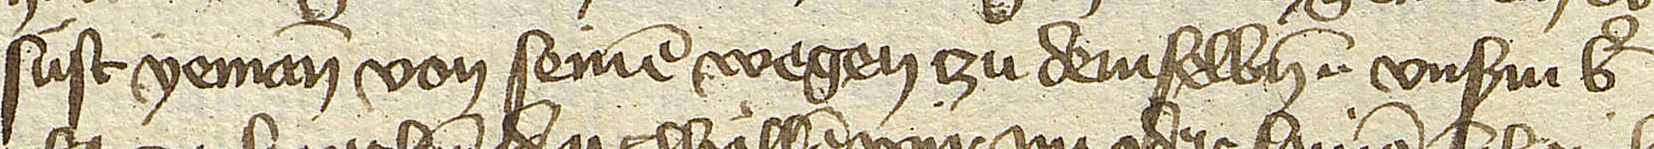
ſüſt yeman* von ſeine* wegen cʒu demſelbn* ~ vnſ*m b*
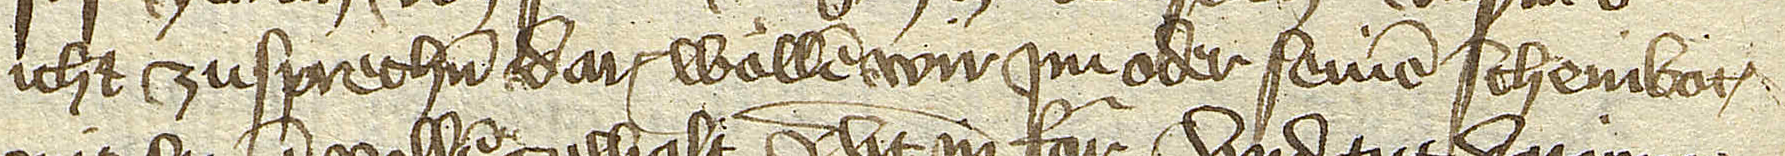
icht cʒuſprechn* dar* wölle* wir Im oder ſeine ſcheinbot*
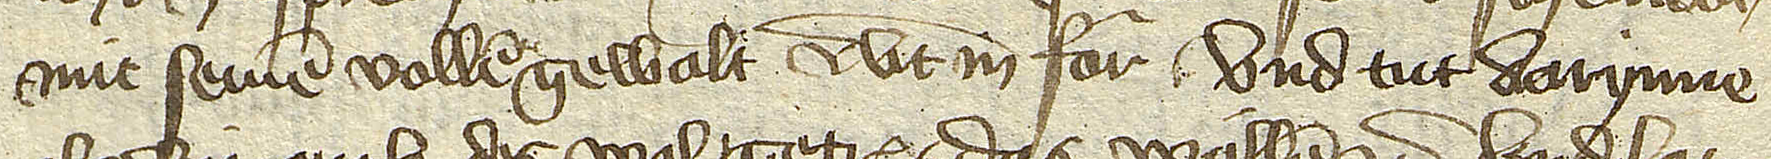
mit ſeine* volle* gewalt ec* vt in for* / vnd tut darynne
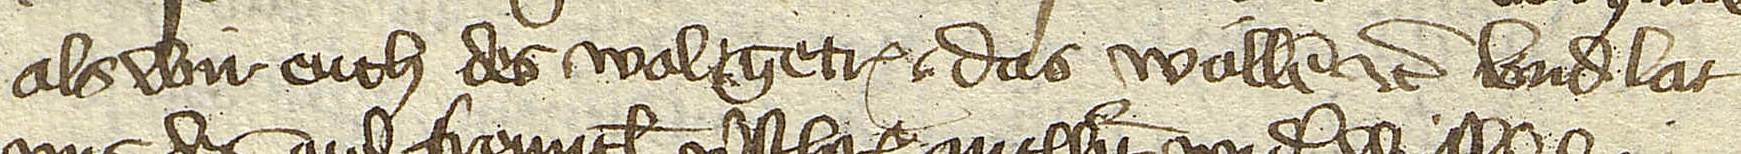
als wir euch des wol getr* / das wölle* ec* vnd lat
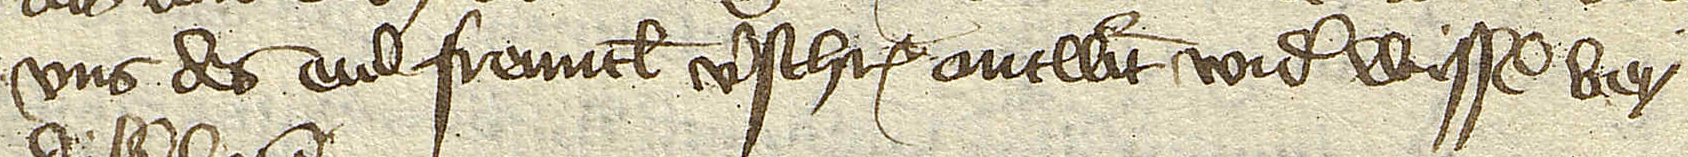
vns des ew* freuntl* v*ſchr* antw*t wid* wiſſe* bey
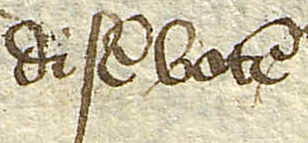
diſe* bote*
